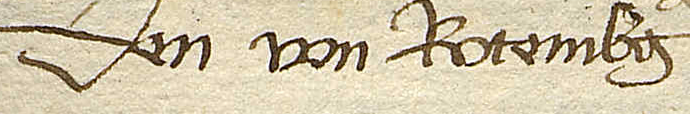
Den von Rotemb*g
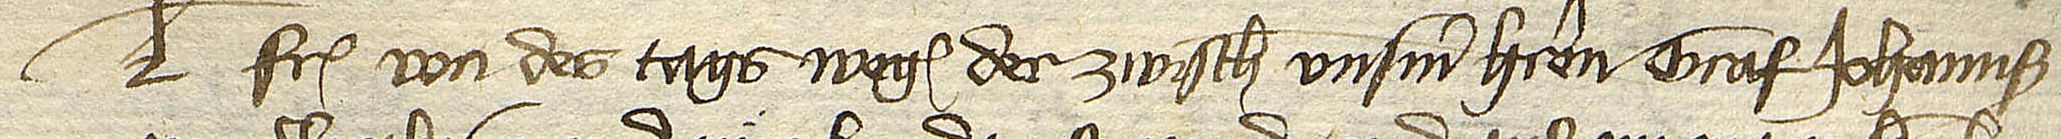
L* fr* von des tags weg* der ʒwiſch* vnſm* h*ren Graf Iohannſ*
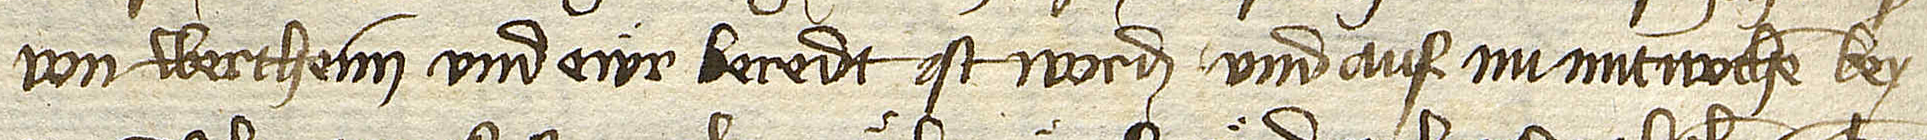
von wertheim vnd eẅr beredt iſt word* / vnd auf nu mitwoche* bey
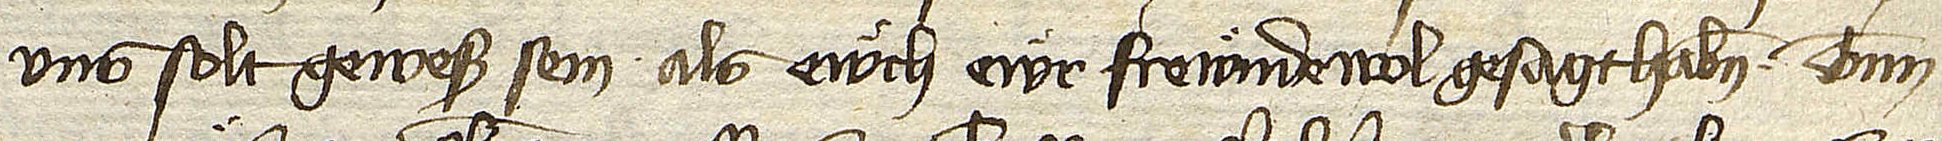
vns ſolt geweſ* ſein . als eẅch eẅr freẅnde wol geſagt habn* . Tun
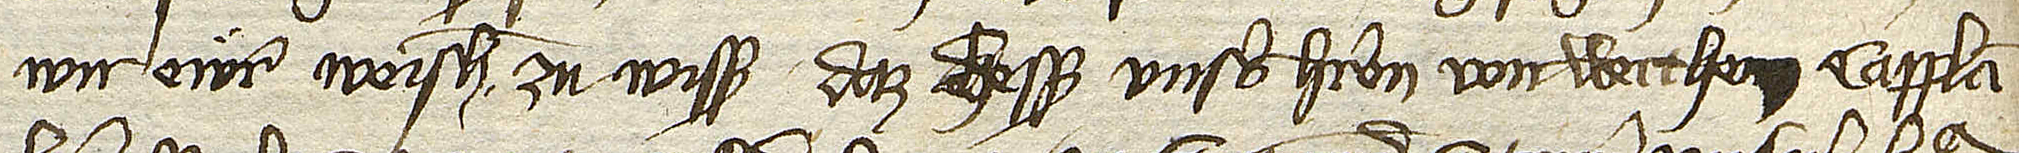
wir eẅr* weiſh* ʒu wiſſ* / Daʒ deſſ* vnſ*s h*ren von wertheim Cappla*
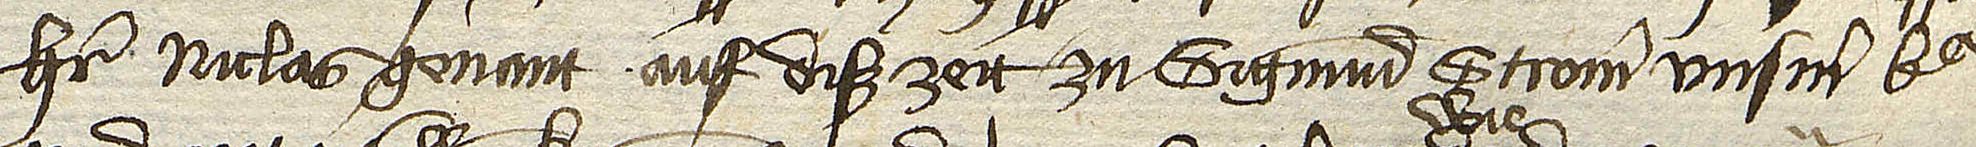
Hr* Niclas genant . auf diſʒ ʒeit / ʒu Sigmund* Strom* vnſm* b*
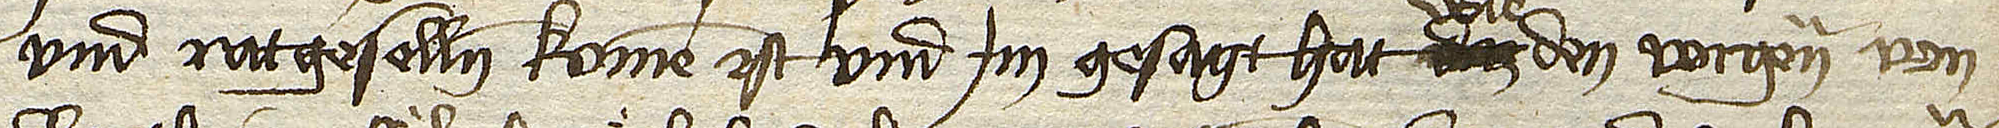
vnd ratgeſelln* kome* iſt vnd Im geſagt hat daʒ den vorgen* von
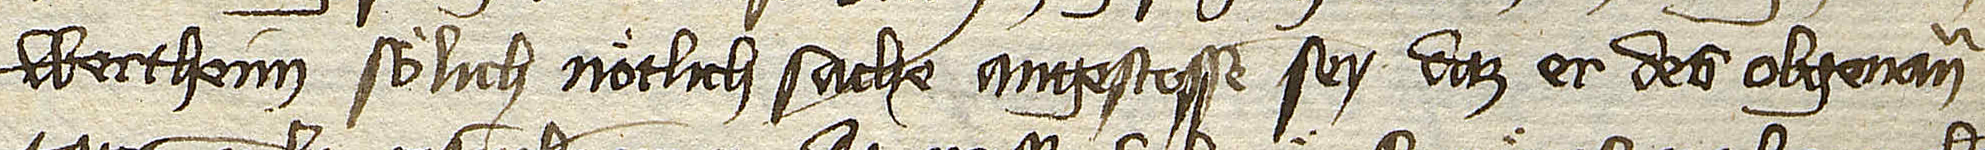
Wertheim ſölich nötlich ſache angeſtoſſe* ſey daʒ er des obgenan*
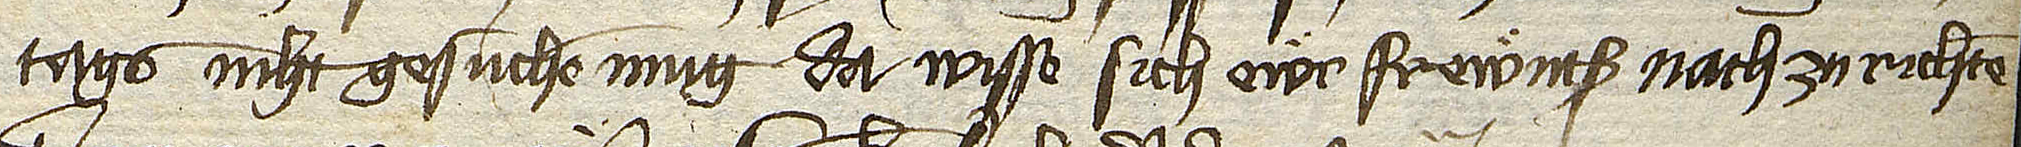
tags niht geſuche* mug / da wiſſe ſich eẅr freẅntſ* nach ʒu richte*
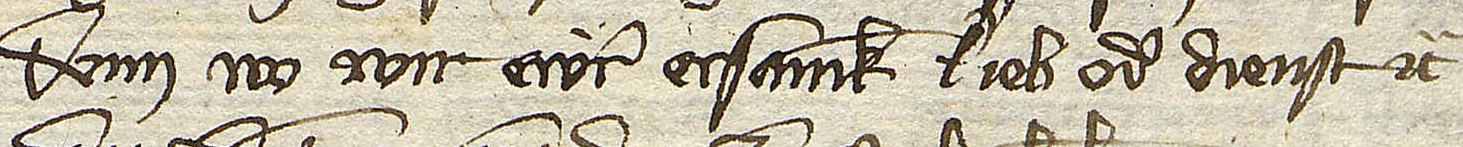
Denn wo wir eẅr* erſamk* lieb od* dienſt ec*
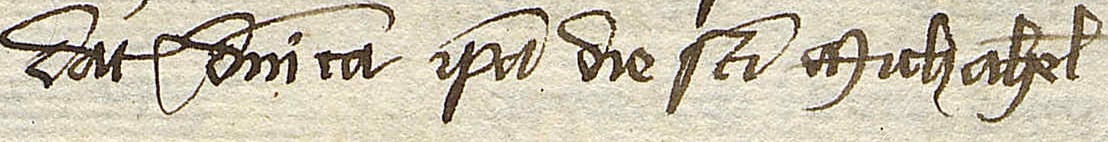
Dat* dnica* ipa* die ſci* Michahel*
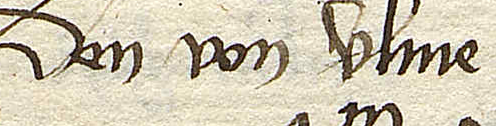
Den von Vlme
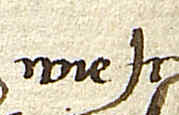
wie Ir
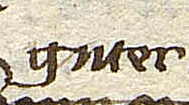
guter
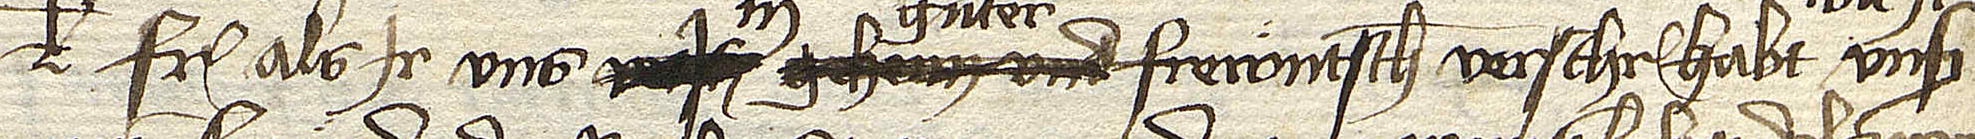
L* fr* / als Ir vns vo* In geheim vnd freẅntſch* verſchr* habt vnſ*
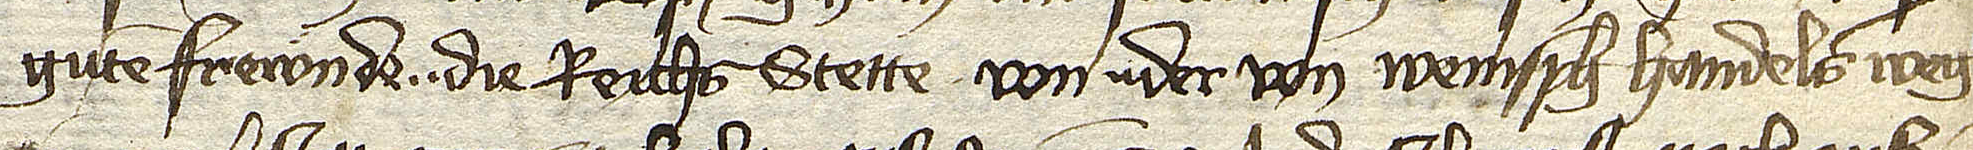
gute* freẅnde ~ die Reichs Stette / von ~ der von weinſp*g handels weg*
